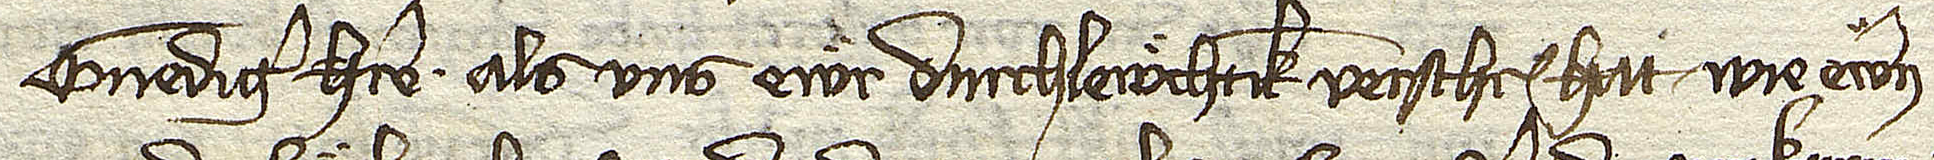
Gnedig* h*re . als vns ewr durchlewchtik* verſchr* hat / wie ew*n
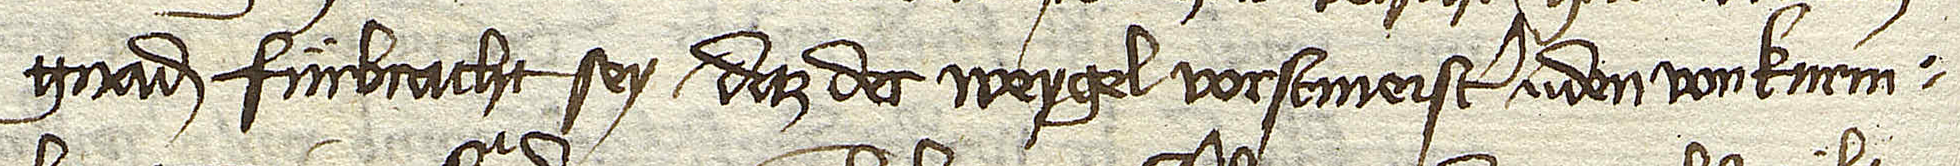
gnad* fürbracht ſey / daʒ der weygel vorſtmeiſt* ~ den von kurm =
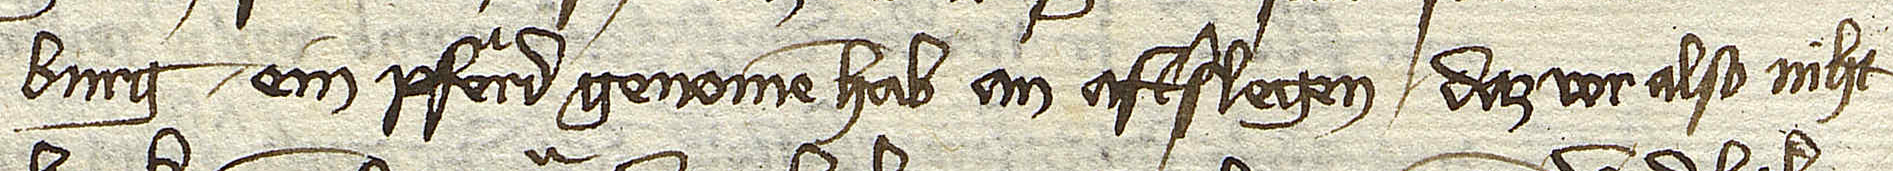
burg / ein pfërd genome* hab an aft*ſlegen / daʒ vor alſo niht
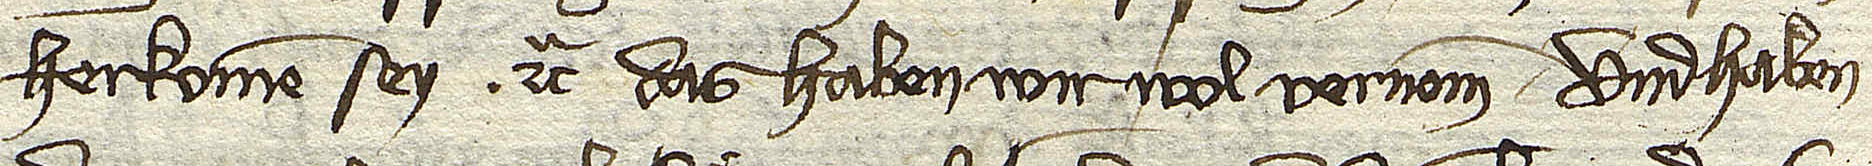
herkome* ſey . ec* das haben wir wol vernom* / Vnd haben
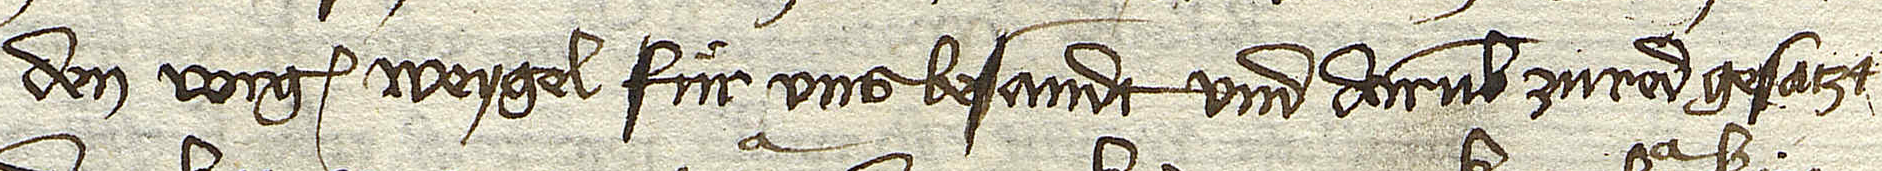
den vorg* weygel für vns beſandt vnd daru*b ʒured geſacʒt
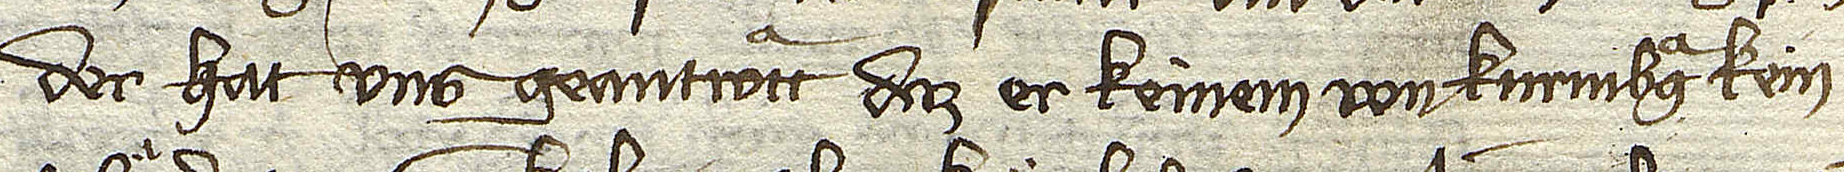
der hat vns geantw*tt daʒ er keinem von kurmb*g kein
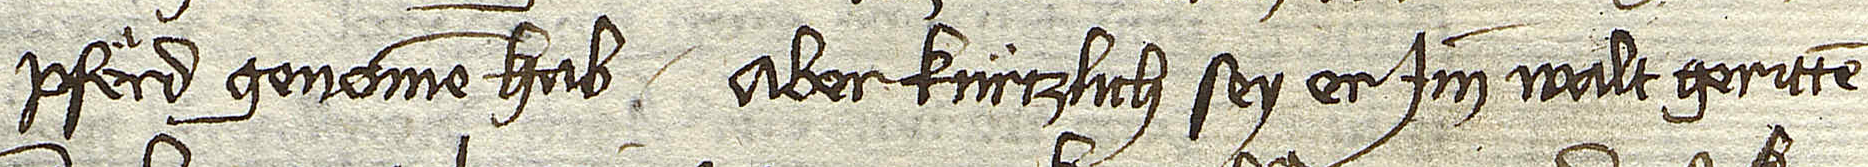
pfërd genome* hab / Aber kürcʒlich ſey er Im* walt geritte*
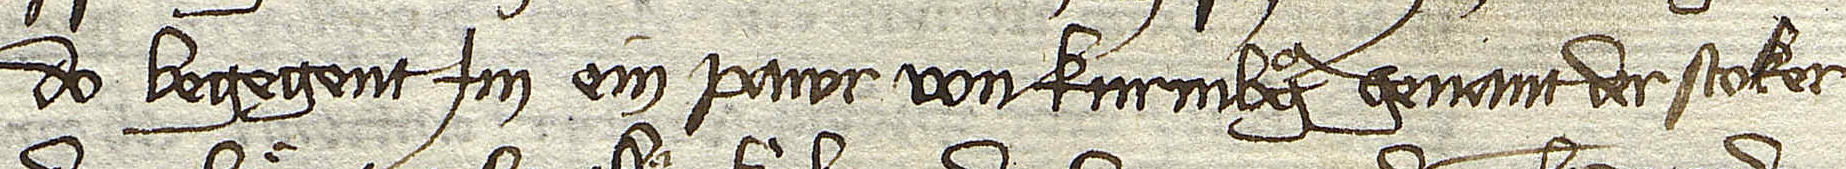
do begegent Im ein pawr von kurmb*g genant der ſtoker
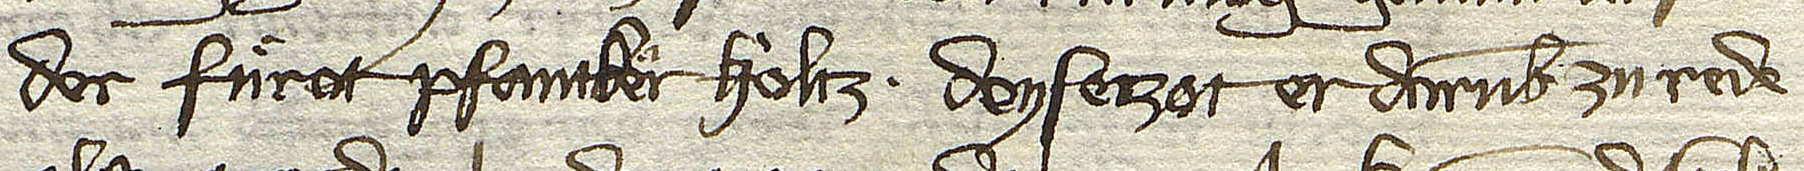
der fürot pfantbër hölcʒ . den ſecʒot er daru*b ʒu rede
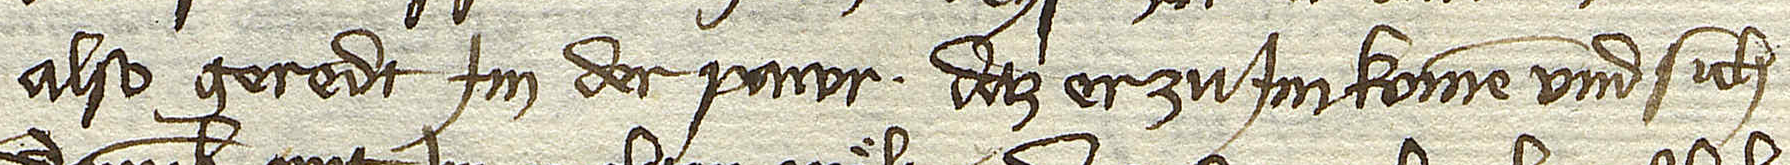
Alſo geredt Im der pawr . daʒer ʒu Im kome* vnd ſich
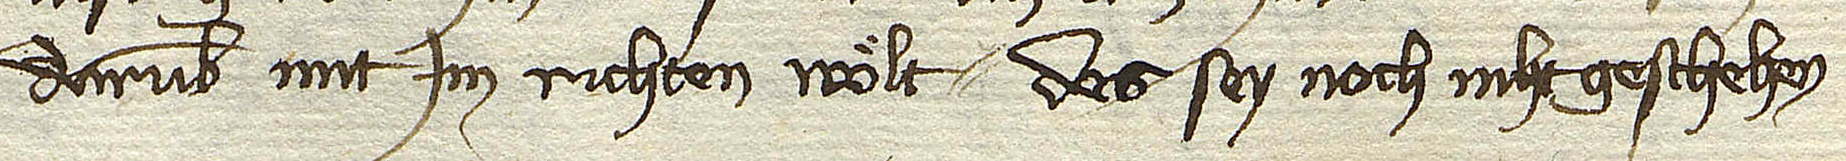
daru*b mit Im richten wölt // Des ſey noch niht geſchehen
